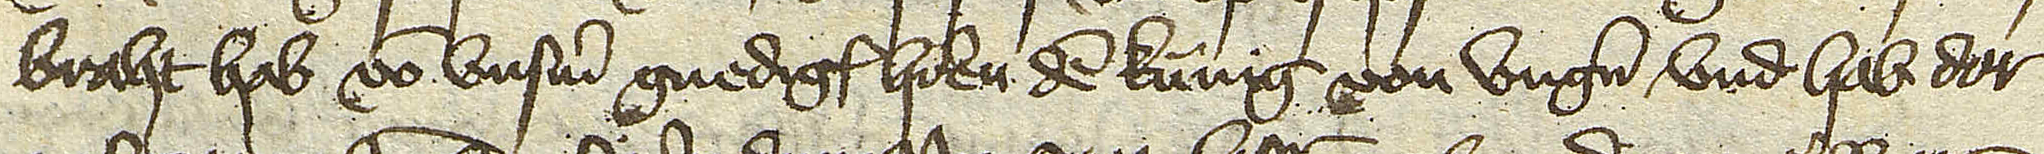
braht hab vo* vnſm* gnedig* hr*en d* künig von Vngn* / vnd hab dar
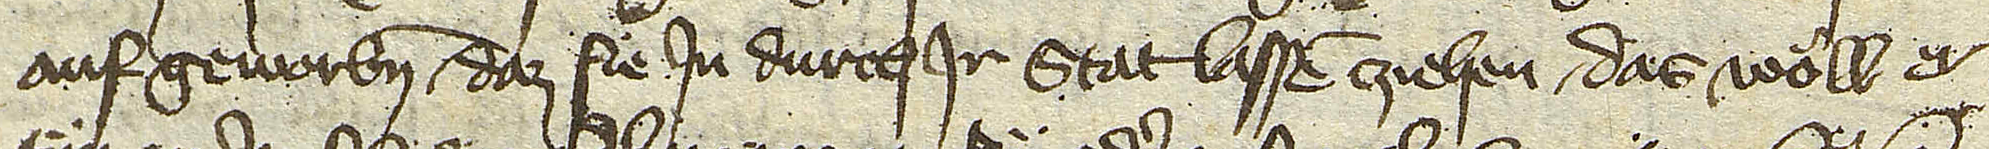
auf geworbn* / daʒ ſie In durch Ir Stat cʒiehen / das wöll er
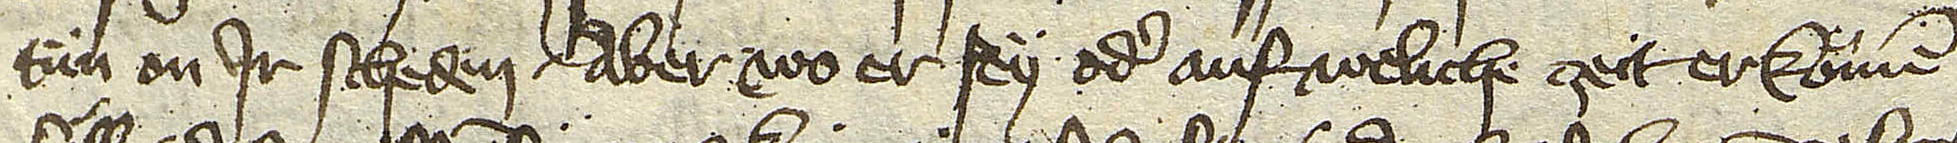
tün on Ir ſcheden / Aber wo er ſey od* auf weliche cʒeit er köme*
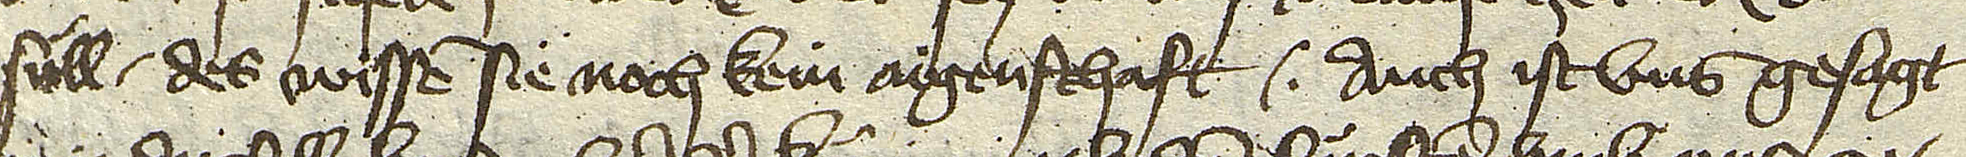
ſüll / des wiſſe* ſie noch kein aigenſchaft / . Auch iſt vns geſagt
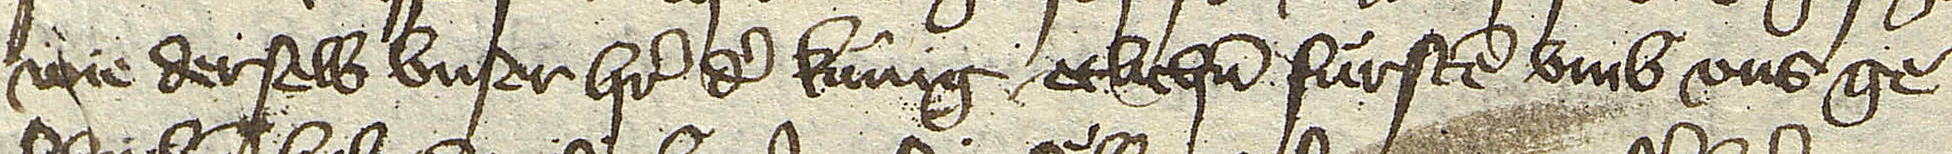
wie derſelb vnſer hr* d* künig etlichn* fürſte* vmb vns ge
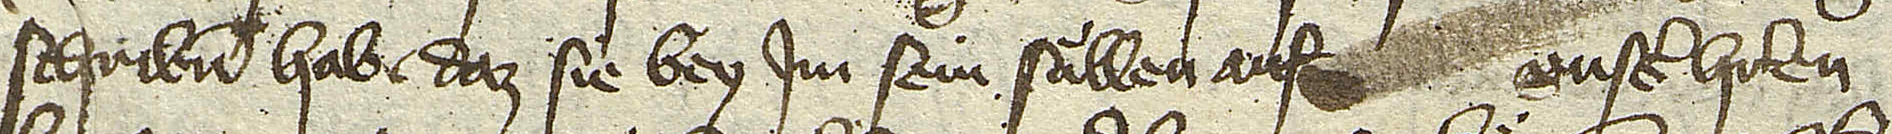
ſchribn* hab / daʒ ſie bey Im ſein ſüllen auf vnſs* hr*en
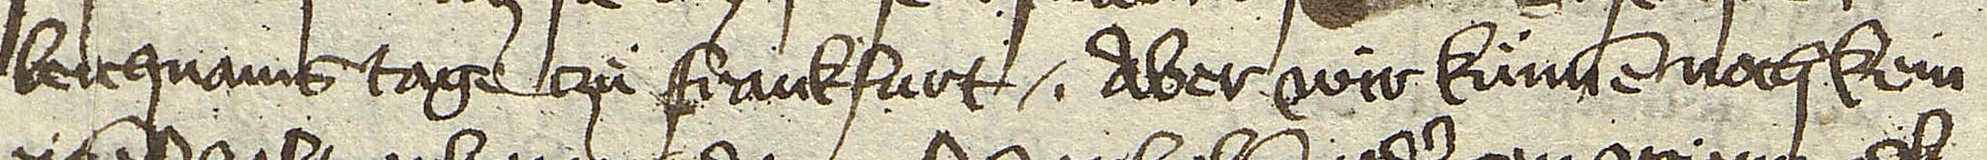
leichnams tage cʒü frankfurt / . Aber wir künne* noch kein
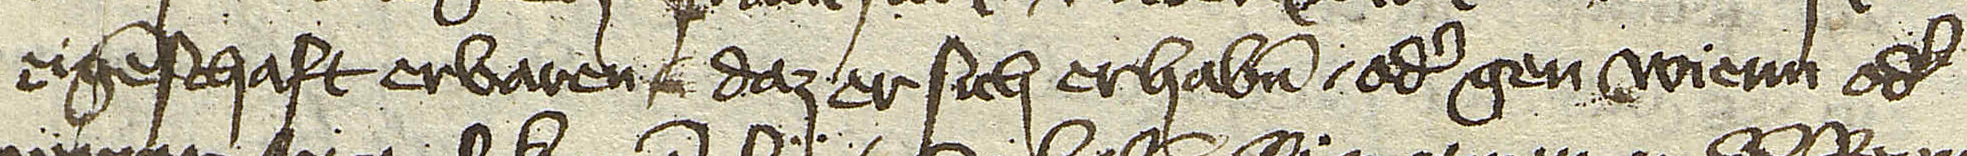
eige*ſchafft ervaren / daʒ er ſich erhabn* / od* gen wienn od*
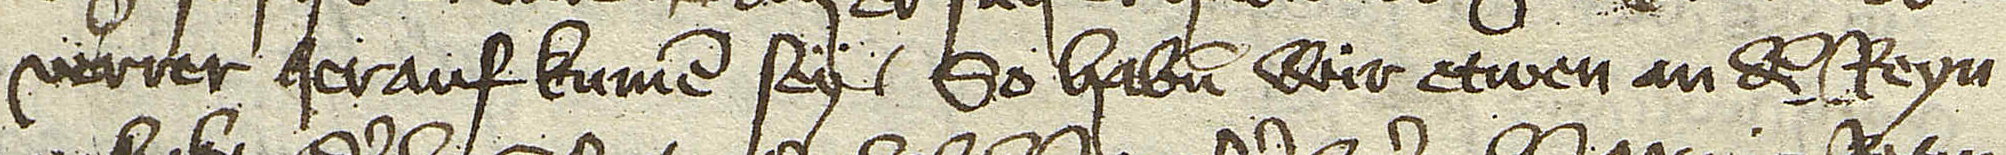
verrer herauf kume* ſey / So habn* wir etwen an d* Reyn
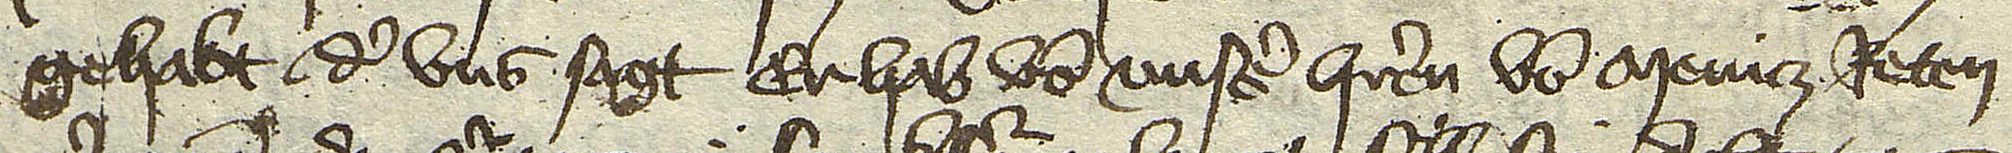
gehabt / d* vns ſagt Er hab vo* vnſs* hr*en vo* Meincʒ Reten
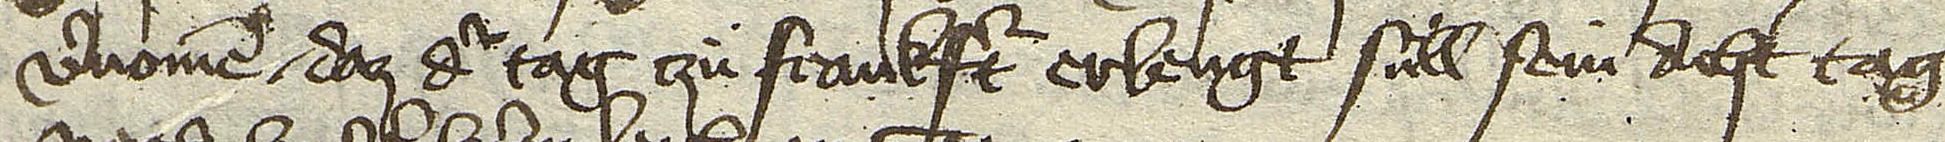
v*nome* / daʒ d* tag cʒü frankf*t erlengt ſüll ſein Acht tag
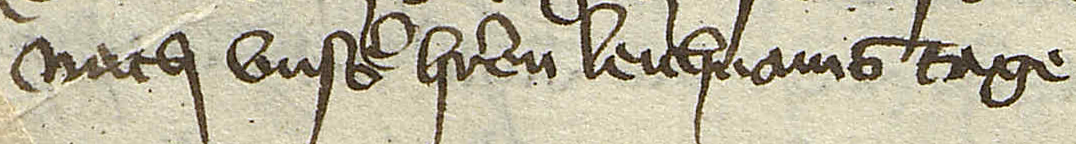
nach vnſs* hr*en leichnams tage
